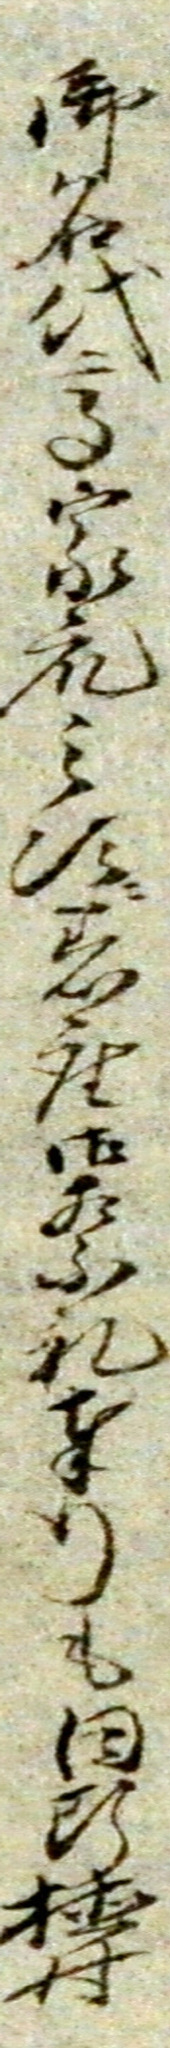御名代高家衆之次ニ着座御祭礼奉行も同断植村
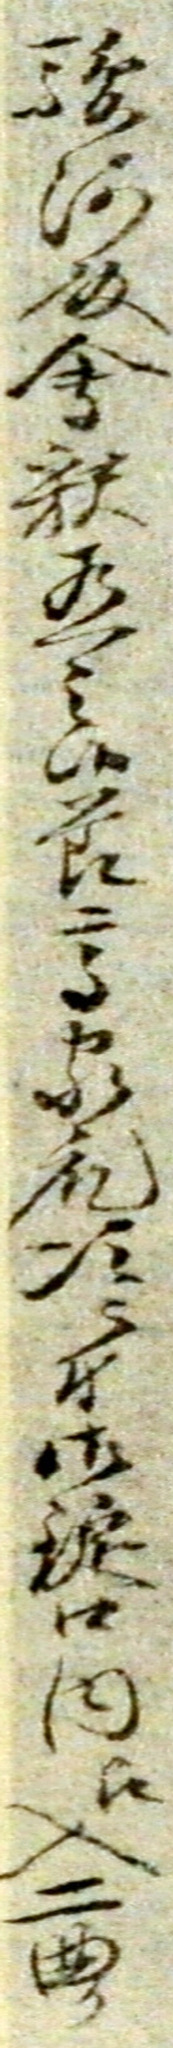駿河殿会釈有之候節致し高家衆次ニ付御錠口内
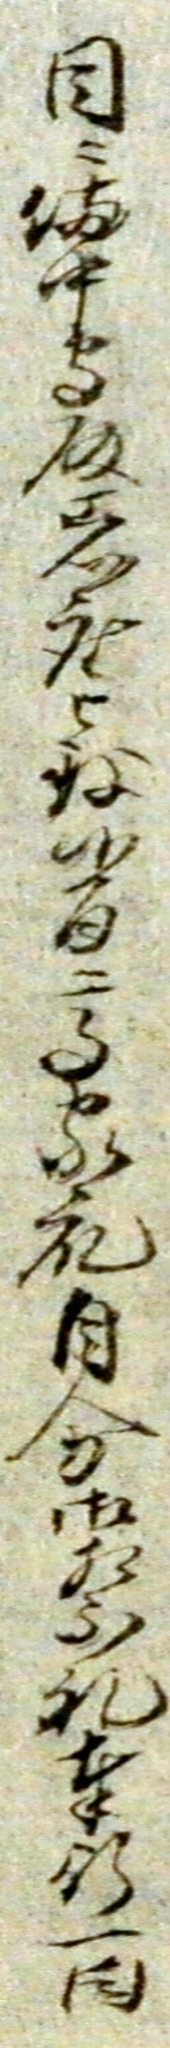江入二曲り目ニ備中守殿着座被高家衆自分御祭礼奉行一
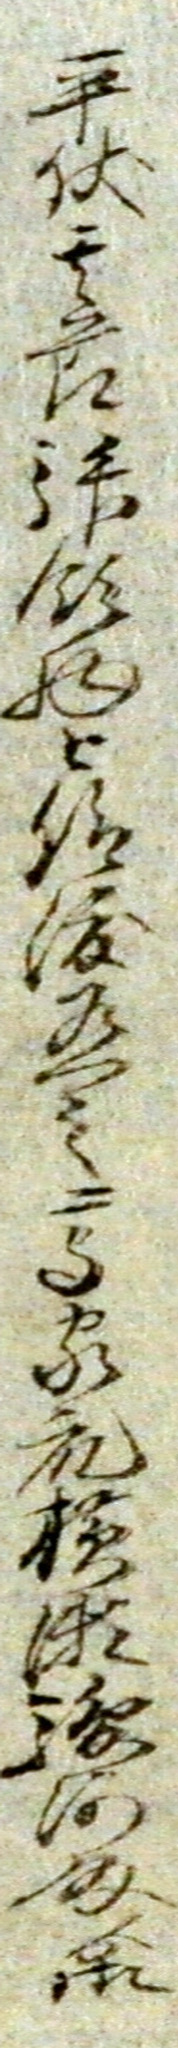同平伏其節拝領物被仰渡有之高家衆横瀬駿河殿ゟ御
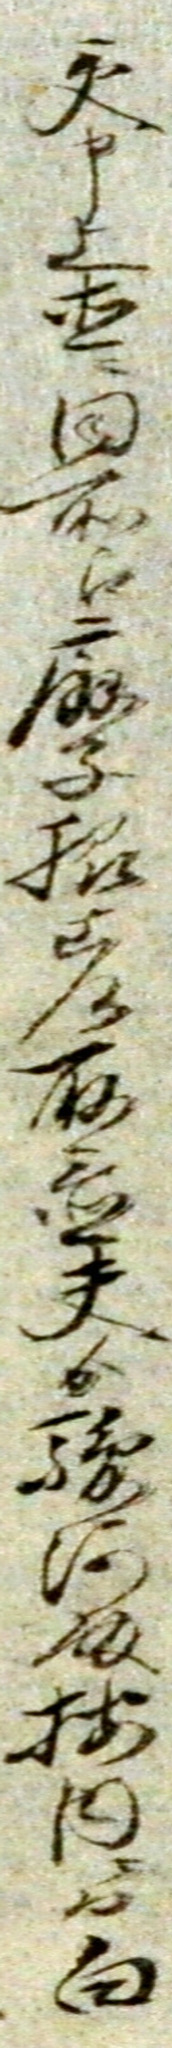受申上直ニ同所江扇子脇差取置夫ゟ駿河殿按内ニ而白鷲
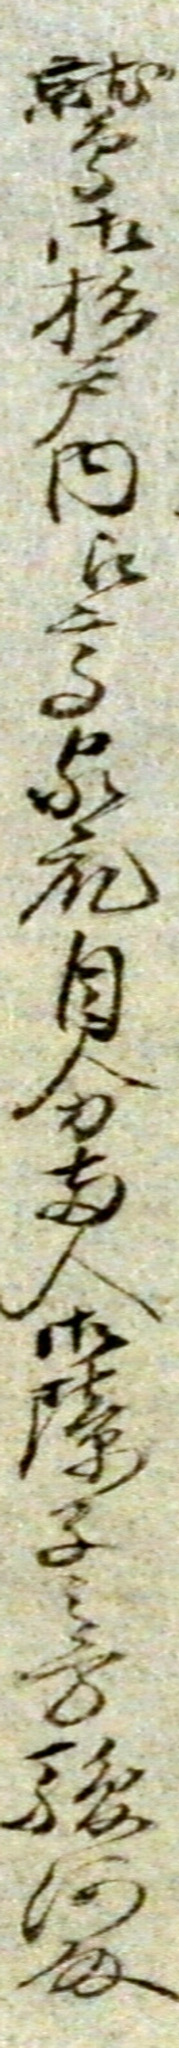御杉戸内江高家衆自分両人御障子之方駿河殿
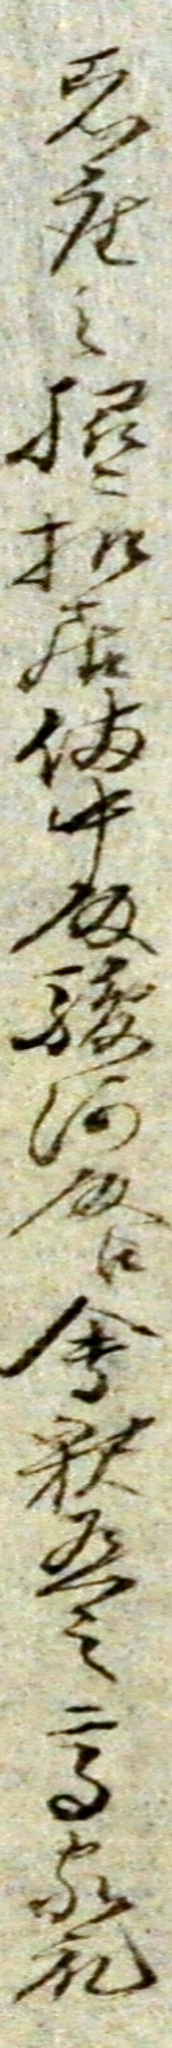着座之脇ニ扣居備中殿駿河殿江会釈有之高家衆
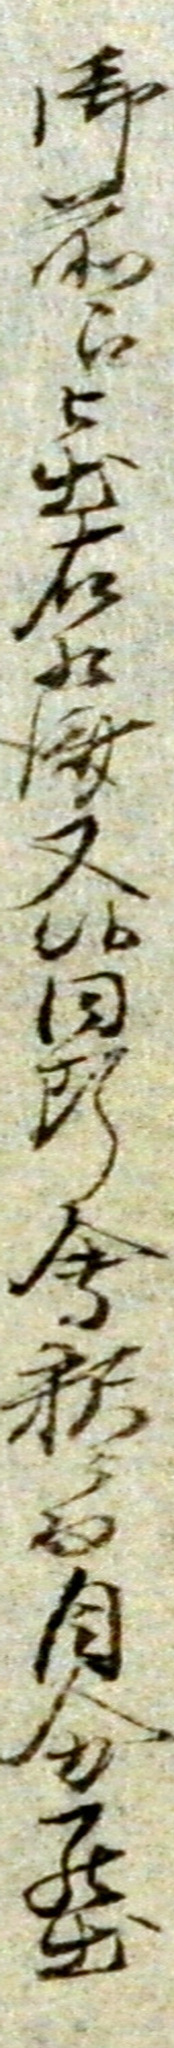御前江被出右相済又候同断会釈ニ而自分罷出
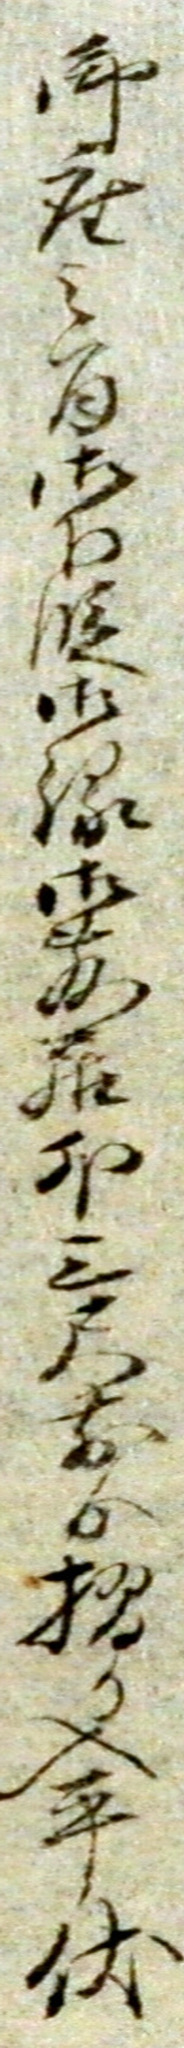御座之間御下段御縁御敷居外三尺前ゟ摺り入平伏
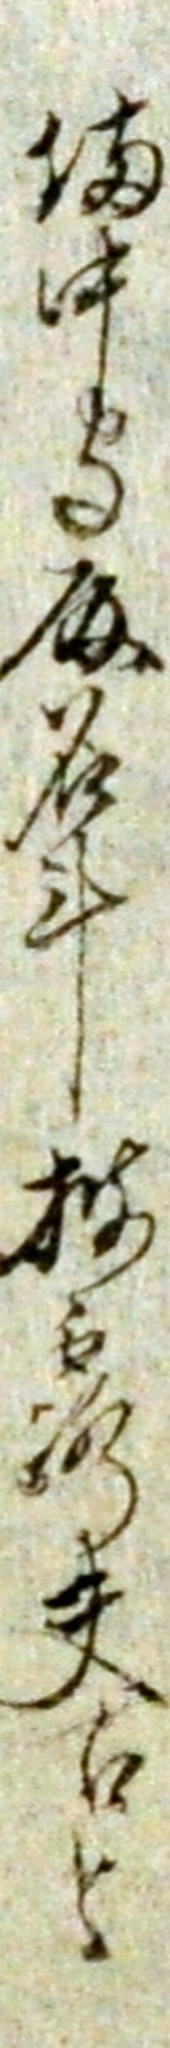備中守殿名斗披露夫江と
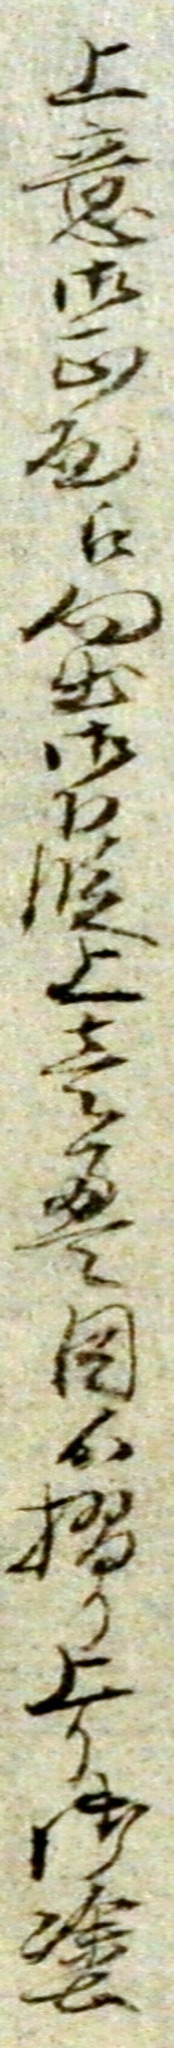上意御正面江向出御下段上壱畳目ゟ摺り上り御塗
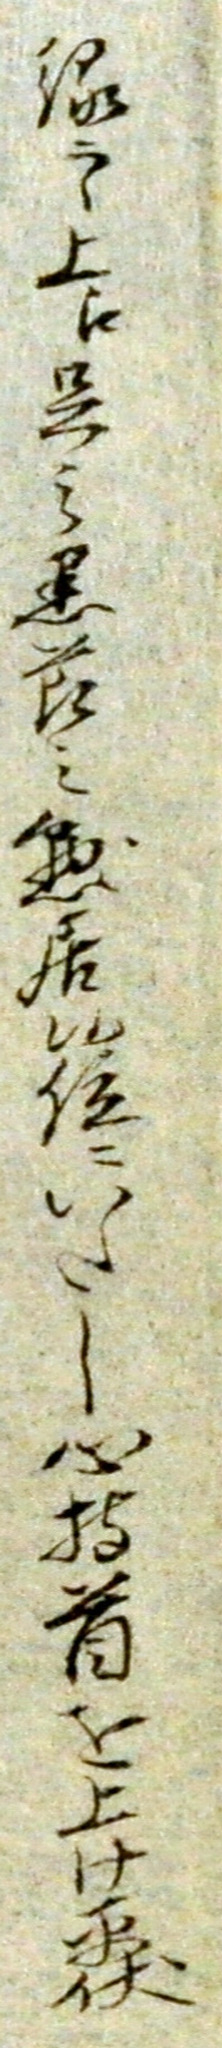縁ニ之上江足之黒節之懸居候位二いたし心持首を上げ平伏
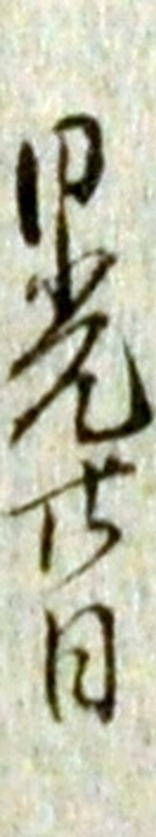日光廿日
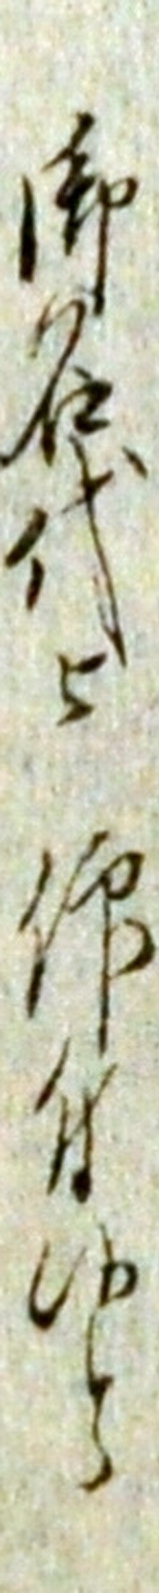名代被仰付候と
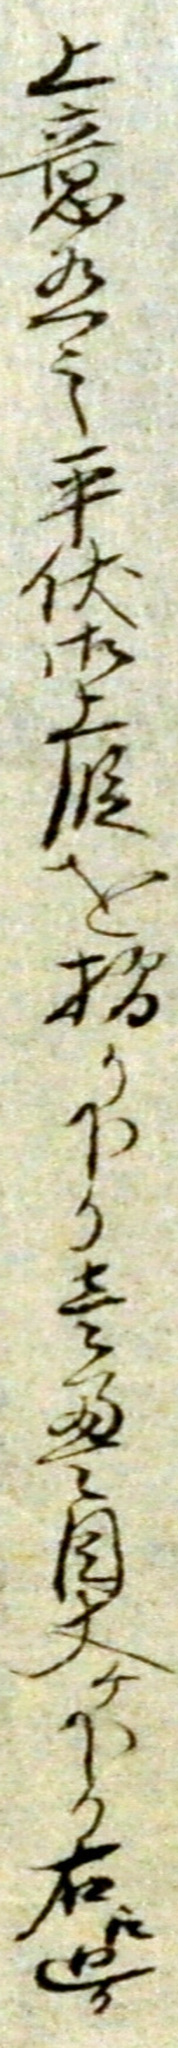上意有平伏御上段を摺り下り壱畳目丈ケ下り右江廻り
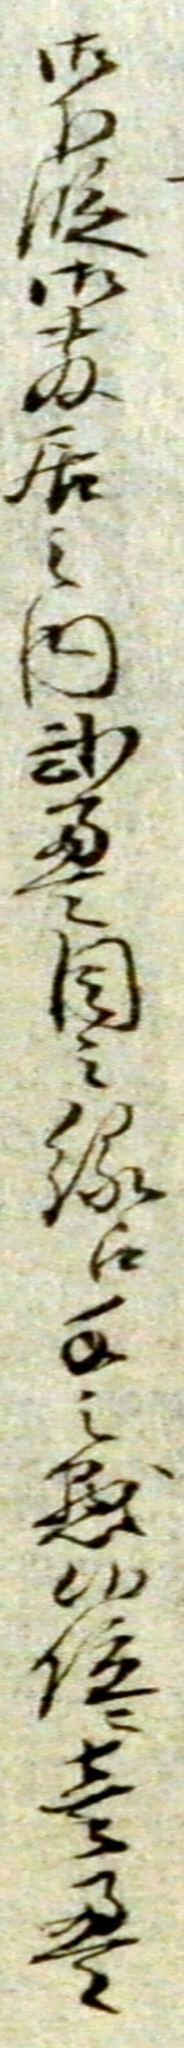御下段御敷居之内弐畳目之縁江手之懸候位ニ壱畳
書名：日光御名代相勤候節ノ留
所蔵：伊那市立高遠町図書館・合同会社AMANE
